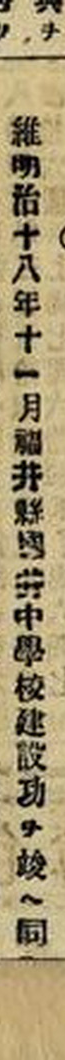維明治十八年十一月福井県福井中学校建設功ヲ竣へ同
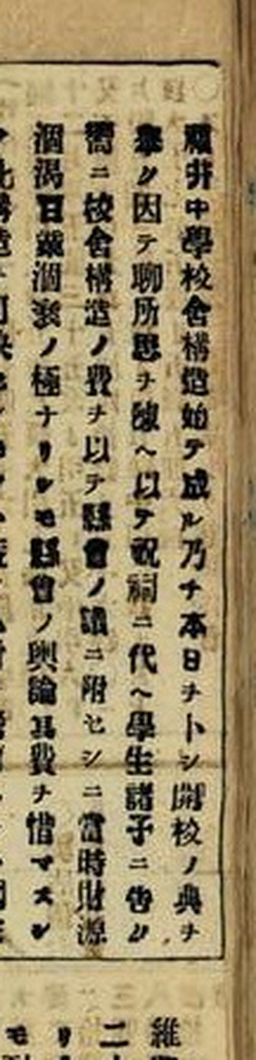挙ク因テ聊所思ヲ陳ヘ以テ祝詞ニ代へ学生諸子ニ告ク
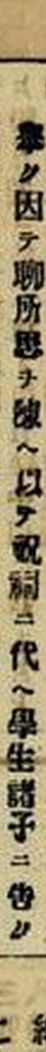挙ク因テ聊所思ヲ陳ヘ以テ祝詞ニ代へ学生諸子ニ告ク
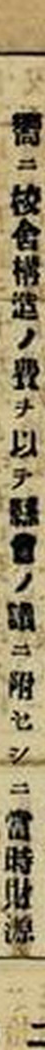嚮ニ校舎構造ノ費ヲ以テ県会ノ讃ニ附セシニ当時財源
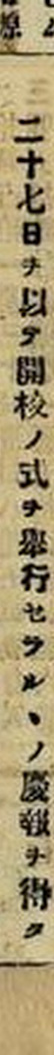二十七日ヲ以テ開校ノ式ヲ挙行セラルヽノ慶報ヲ得タ
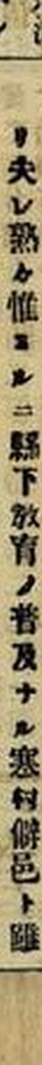リ夫レ熟々惟ユルニ県下教育ノ普及ナル寒村僻邑ト雖
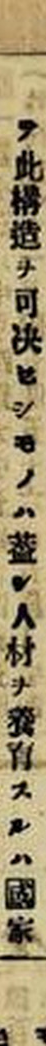テ此構造ヲ可決セシモノハ蓋シ人材ヲ養育スルハ国家
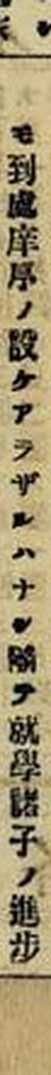モ到処庠序ノ設ケアラザルハナシ隋テ就学諸子ノ進歩
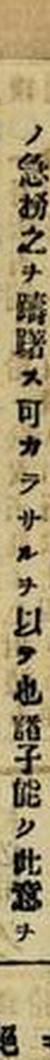ノ急務之ヲ躊躇ス可カラサルヲ以テ也諸子能ク此意ヲ
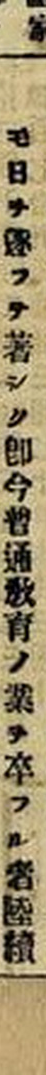モ日ヲ遂ツテ著シク即今普通教育ノ業ヲ卒フル者陸続
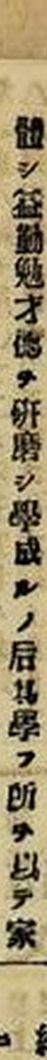体シ益勤勉才徳ヲ研磨シ学成ルノ后其学フ所ヲ以テ家
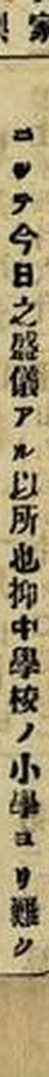ニシテ今日之盛儀アル以所也抑中学校ノ小学ヨリ難ク
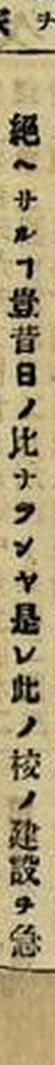絶ヘサルヿ豈昔日ノ比ナランヤ是レ此ノ校ノ建設ヲ急
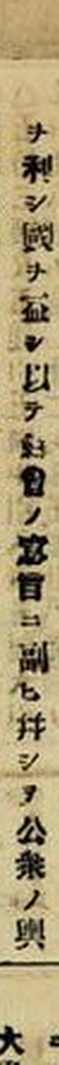ヲ利シ国ヲ益シ以テ県会ノ意旨ニ副ヒ并シテ公衆ノ与
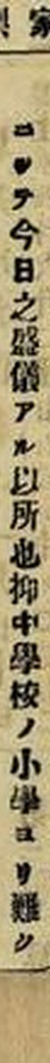ニシテ今日之盛儀アル以所也抑中学校ノ小学ヨリ難ク
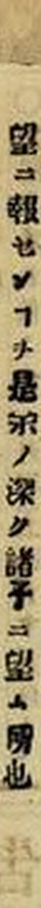望ニ報センヿヲ是余ノ深ク諸子ニ望ム所也
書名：温古集 五巻
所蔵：福井県文書館 Fukui Prefectural Archives
